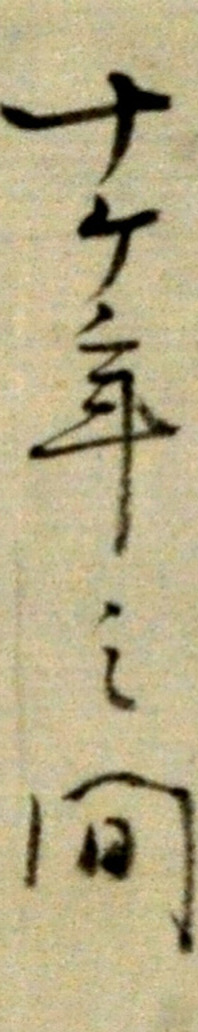十ヶ年之間
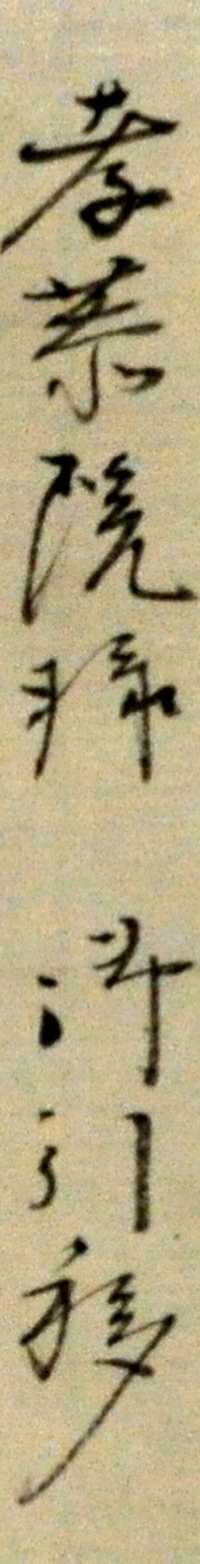孝恭院様御引移
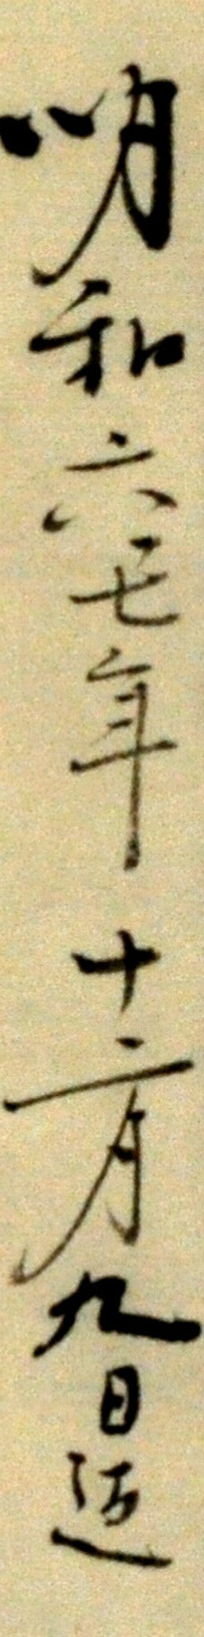明和六丑年十二月九日迄
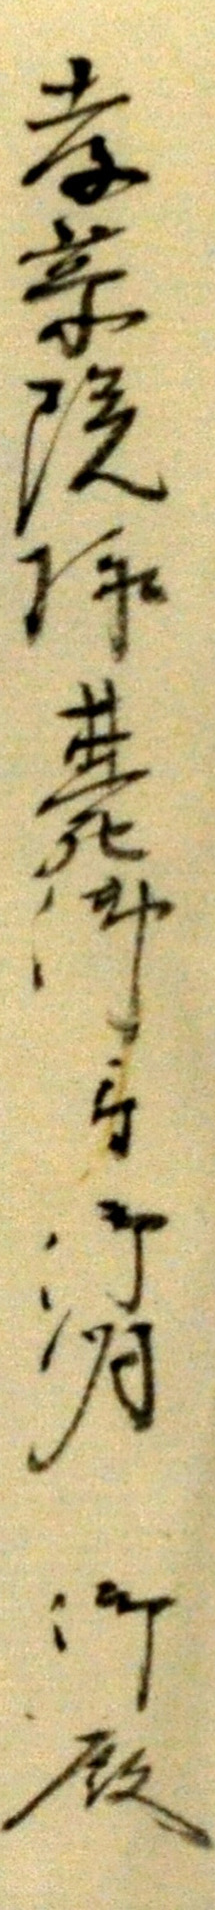孝恭院様薨御に付御明御殿
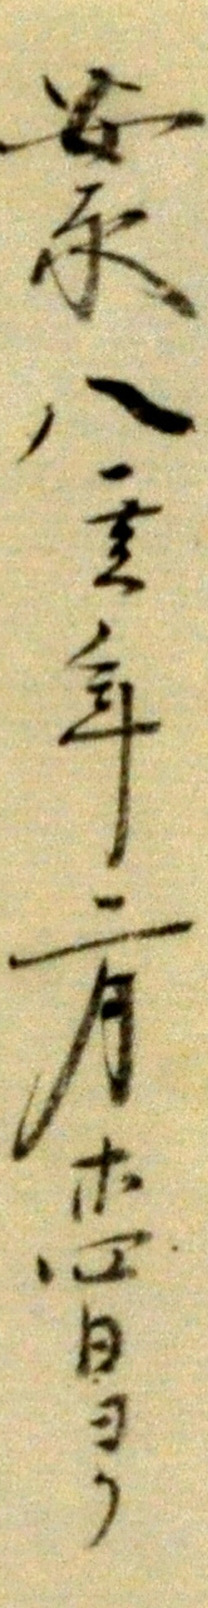安永八亥年二月廿四日ヨリ
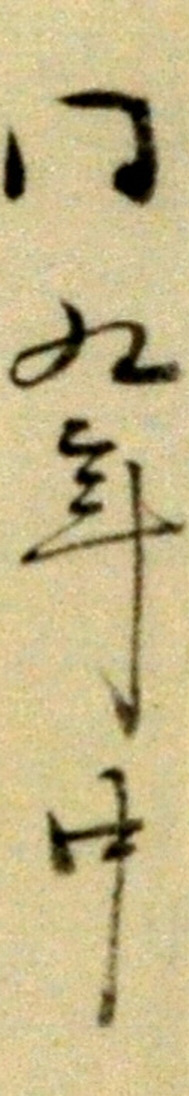同九年中
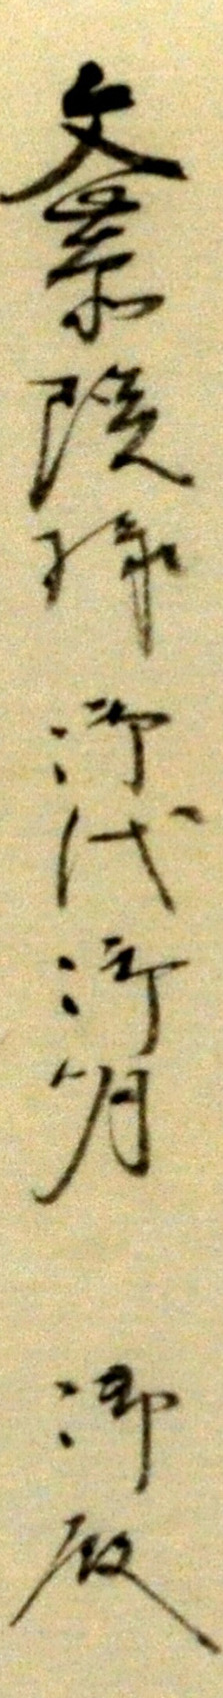文恭院様御代御明御殿
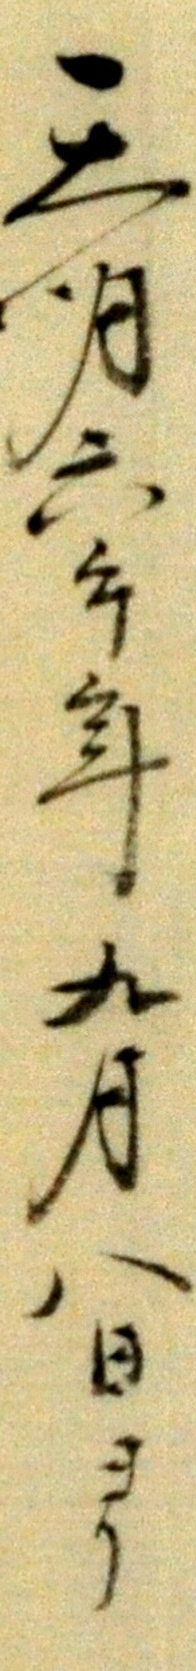天明六午年九月八日ヨリ
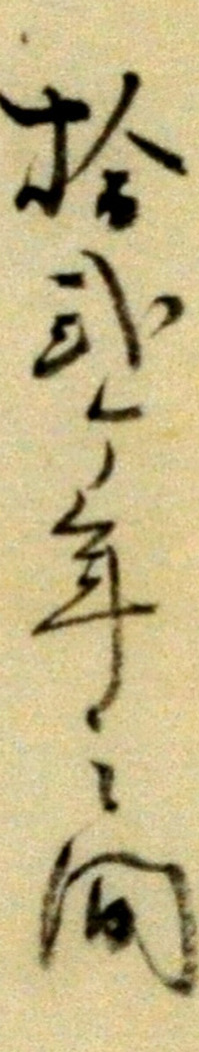拾弐ヶ年之間
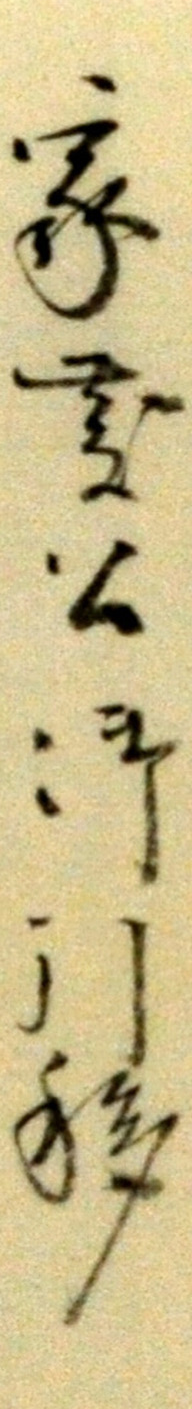家慶公御引移
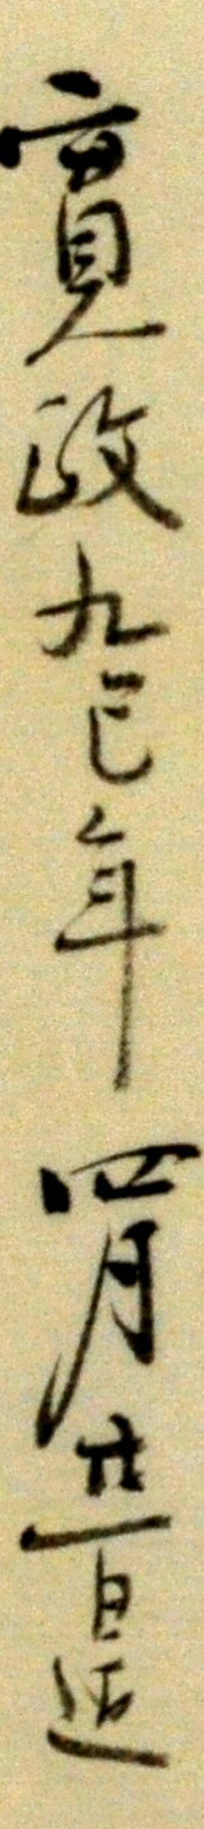寛政九巳年四月廿一日迄

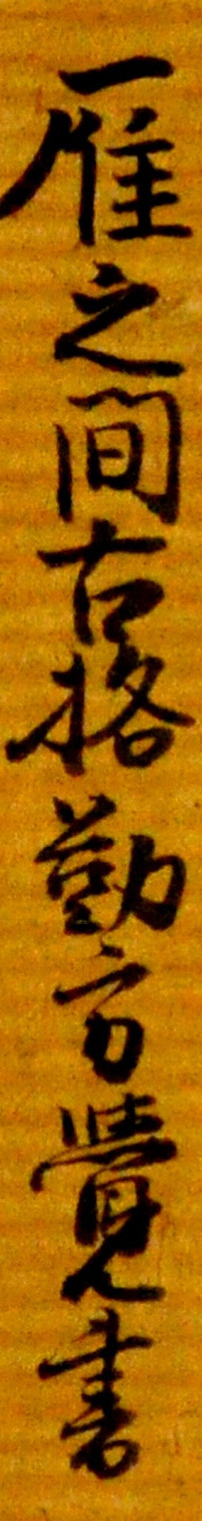雁之間古格勤方覚書
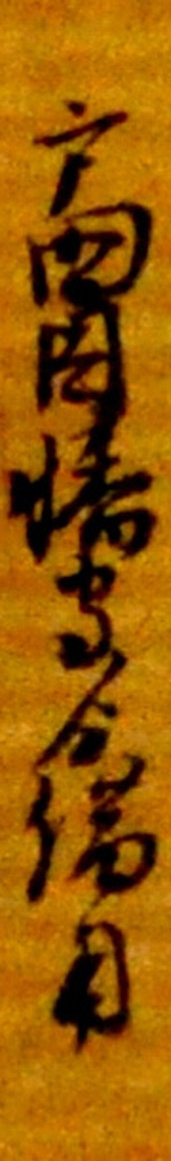戸田因幡守ゟ借用
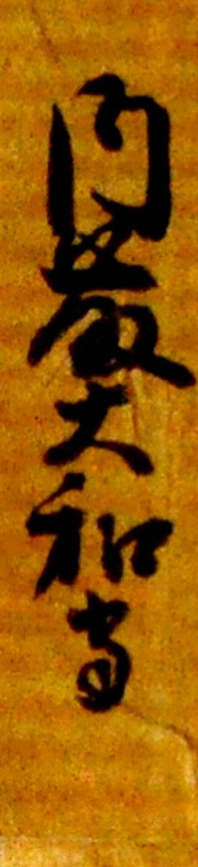内藤大和守

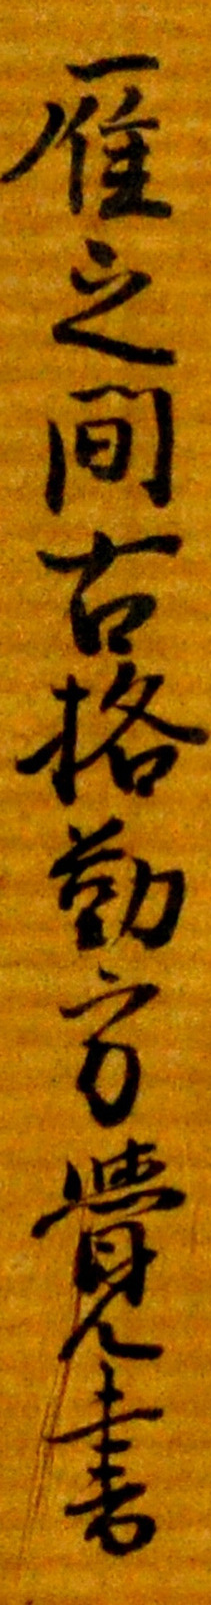雁之間古格勤方覚書
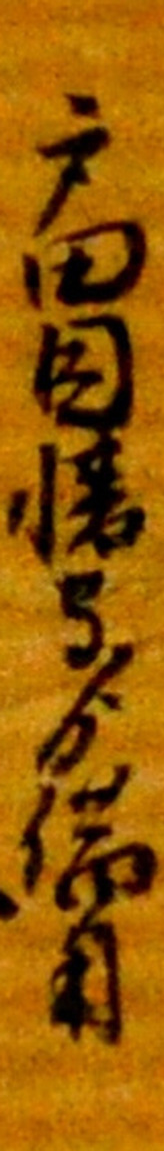戸田因幡守ゟ借用
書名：申合帳〔一括〕
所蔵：伊那市立高遠町図書館・合同会社AMANE
